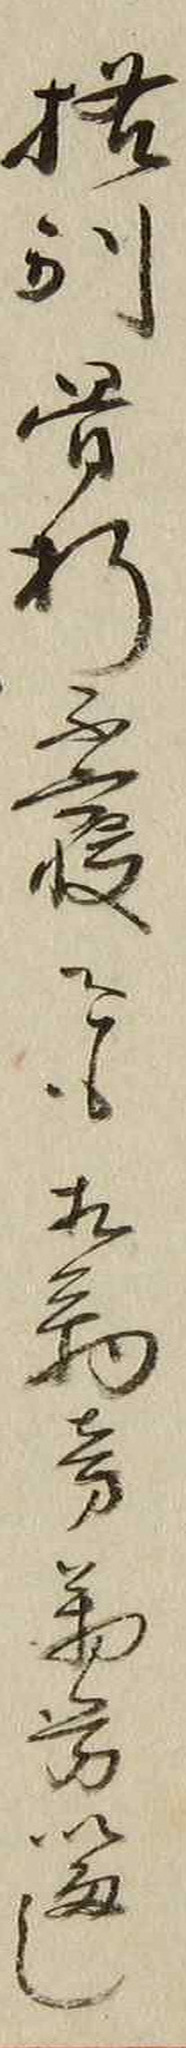格別骨折不寝をも相勤旁勤労いたし
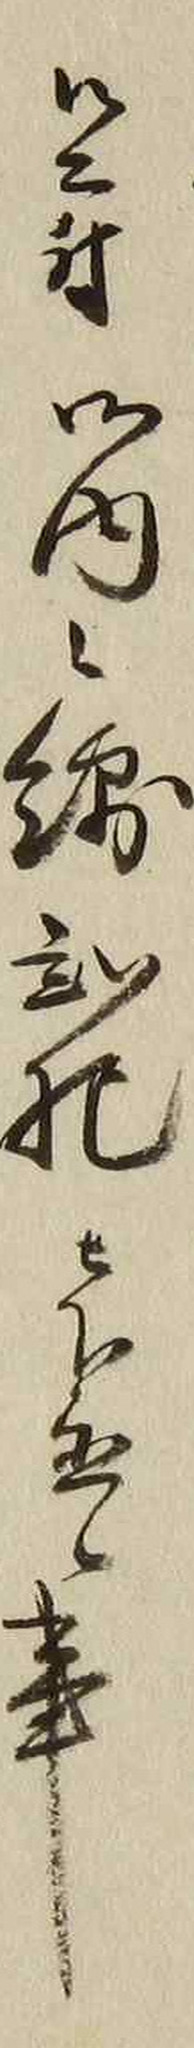候ニ付御内々綿弐把被下置候事
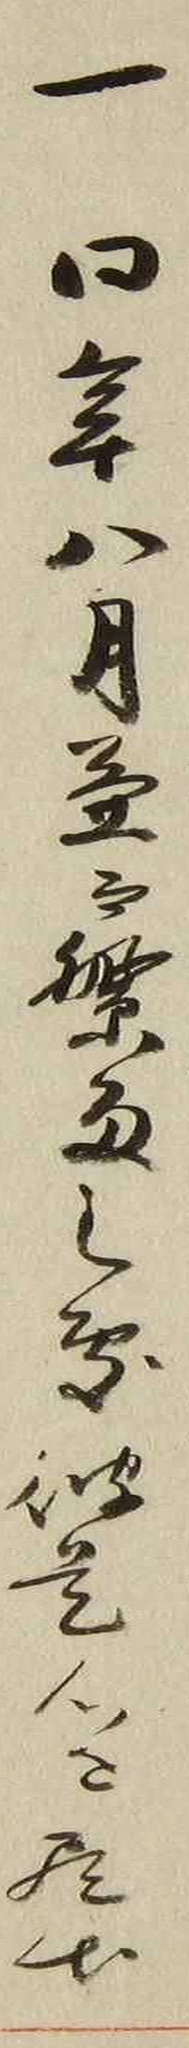一同年八月兼而繁多之処彼是心を尽出
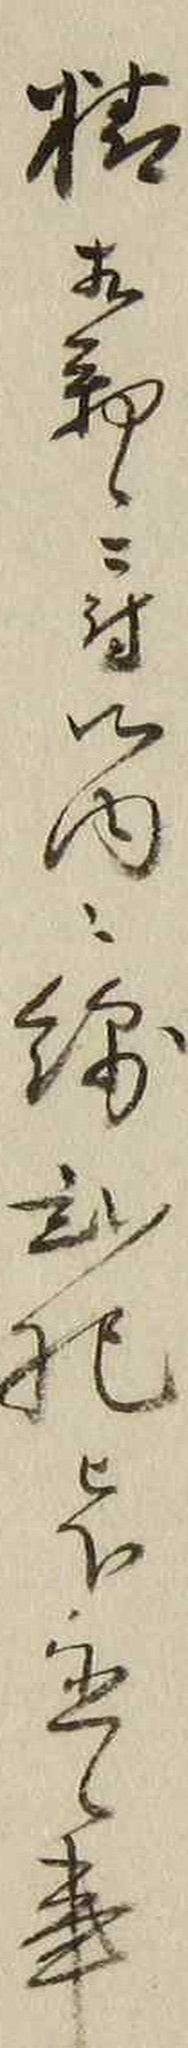精相勤候ニ付御内々綿弐把被下置候事
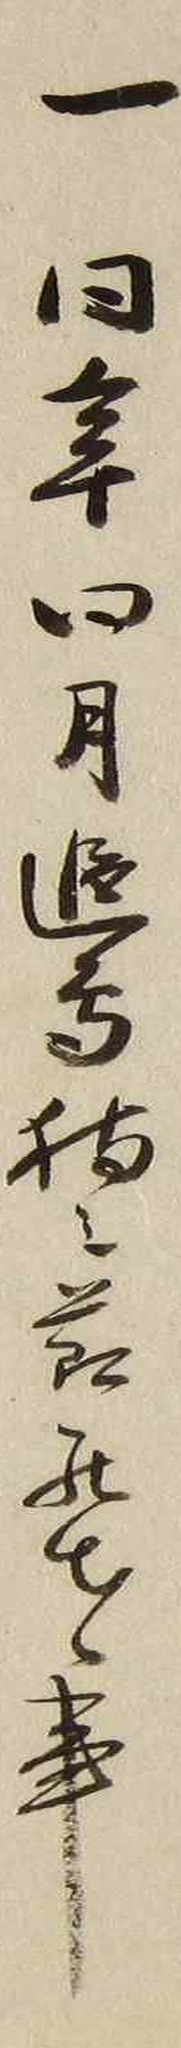一同年同月追鳥狩之節罷出候事
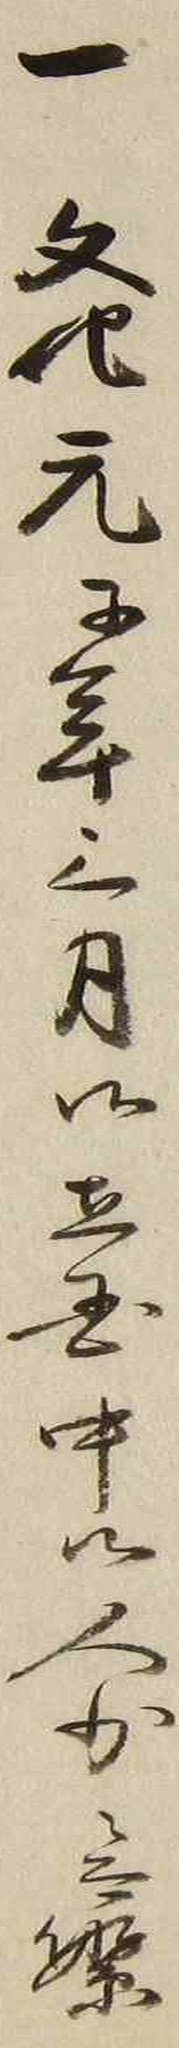一文化元子年三月御在国中御人少ニ而繁
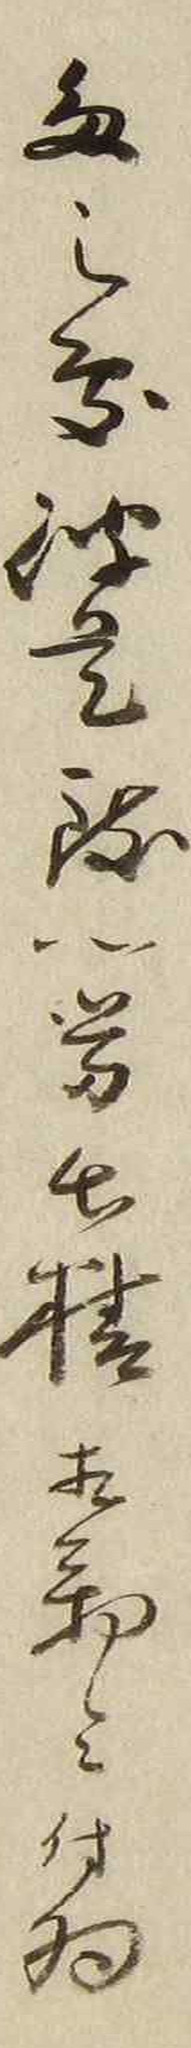多之処彼是致心労出精相勤候ニ付為
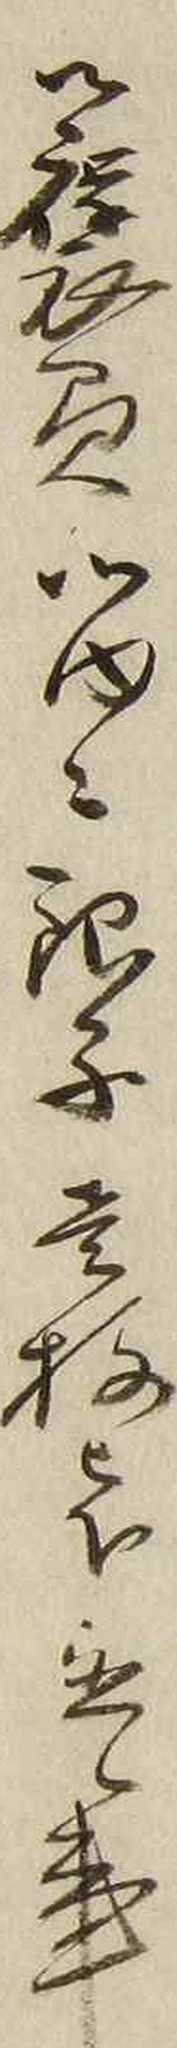御褒美御内々銀子壱枚被下置候事

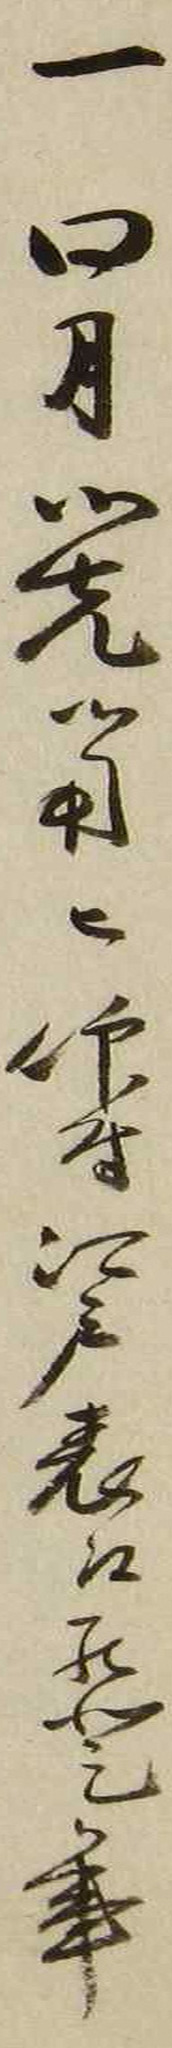一同月御先御用被仰付江戸表江罷登候事
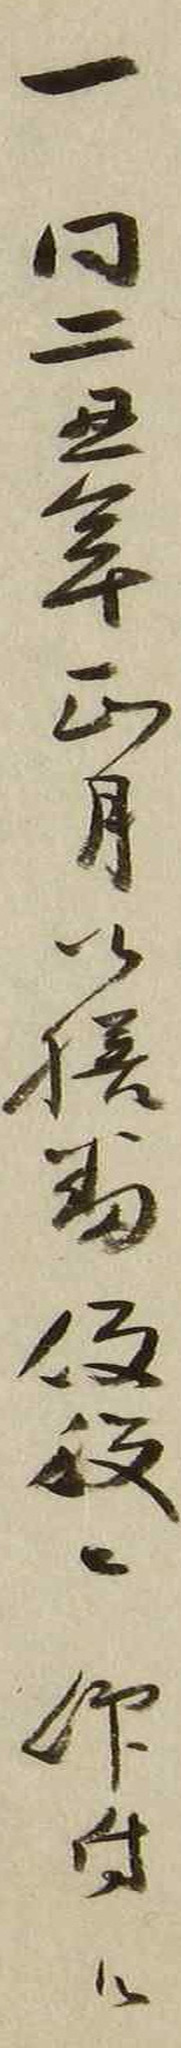一同二丑年正月御膳番仮役被仰付候
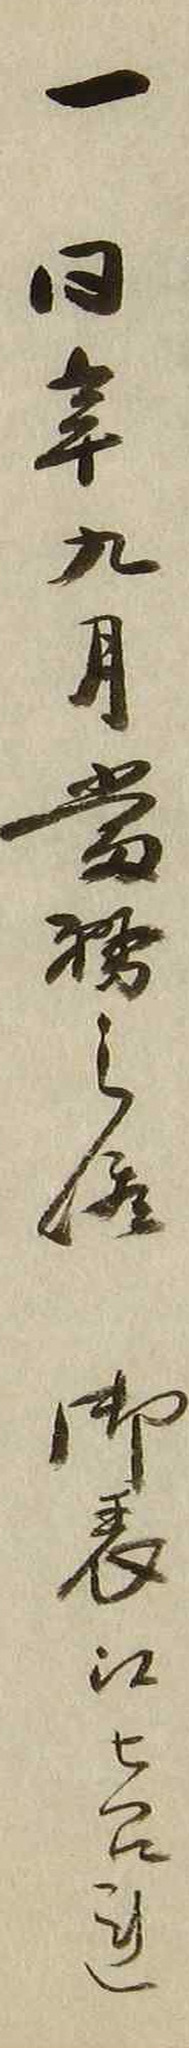一同年九月当務之侭御表江召連
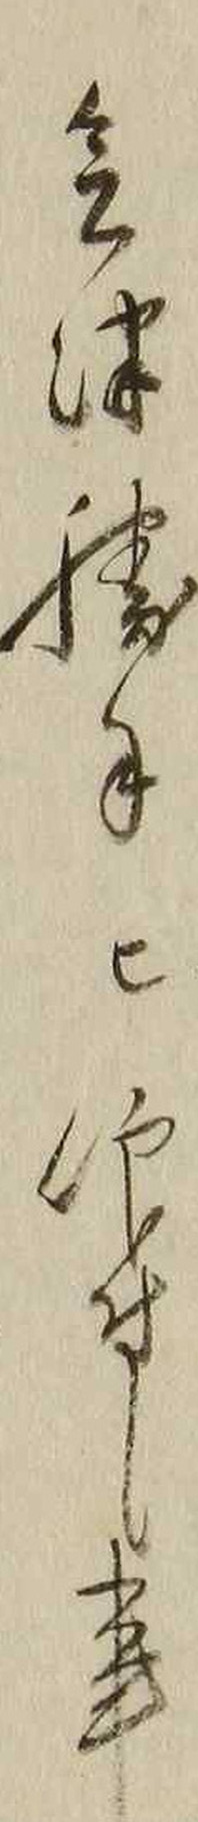会津勝手被仰付候事
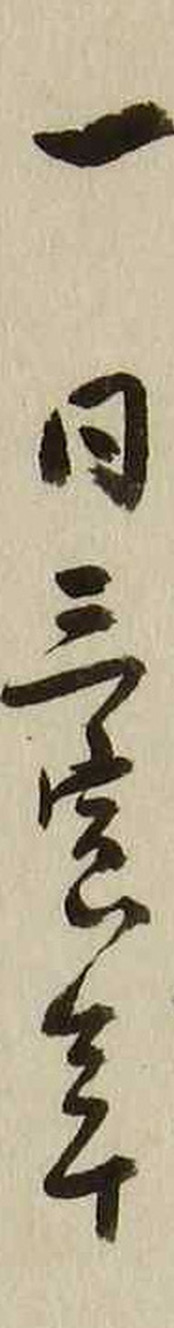一同三寅年
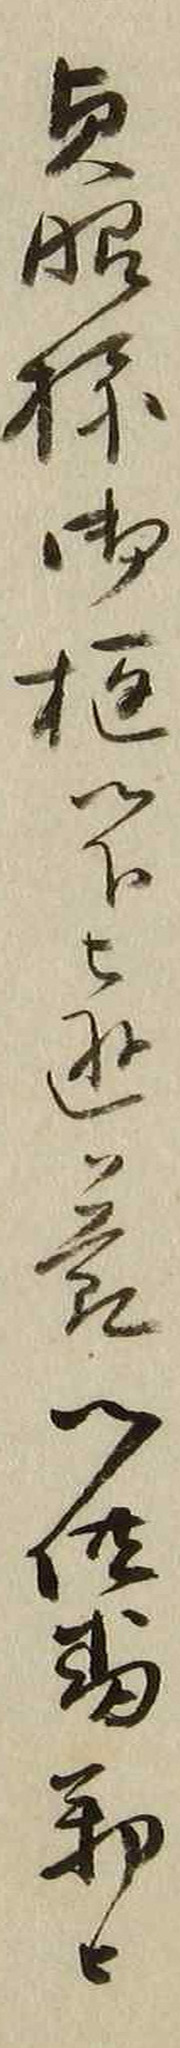貞昭様御枢御下被遊候節御供番勤被
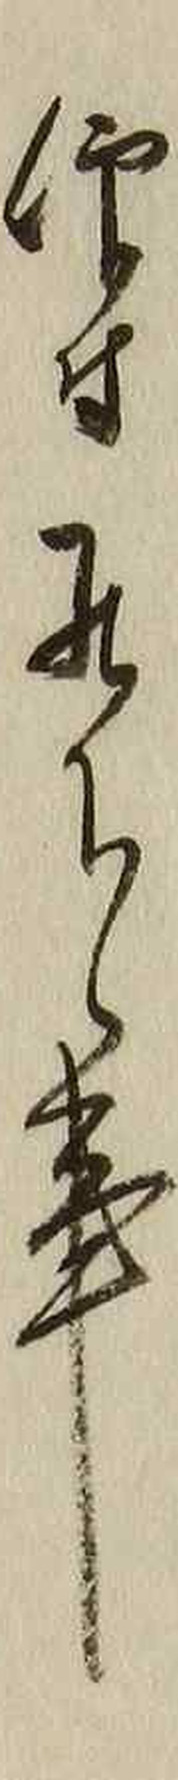仰付罷下候事
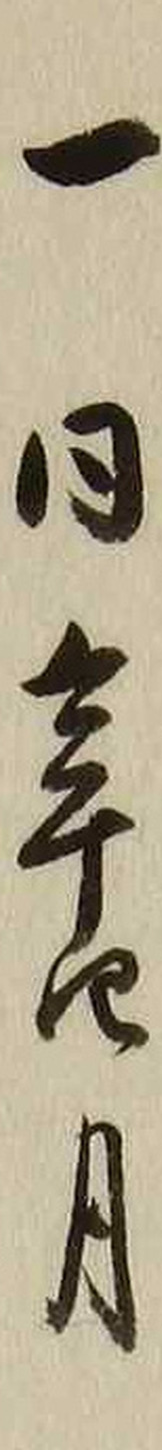一同年四月
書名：諸士系譜　巻之311　し之部1
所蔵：会津若松市立会津図書館
